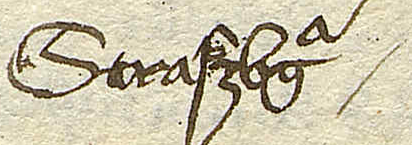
Straſʒb*g /
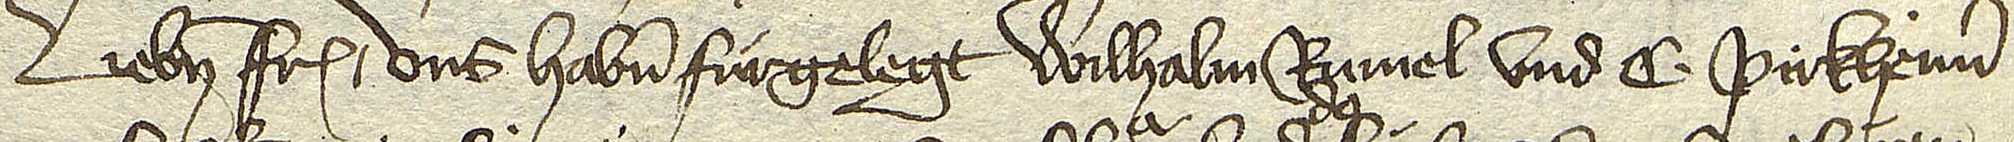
Liebn* fr* / Vns habn* fürgelegt Wilhalm Rumel vnd C . Pirkheim*
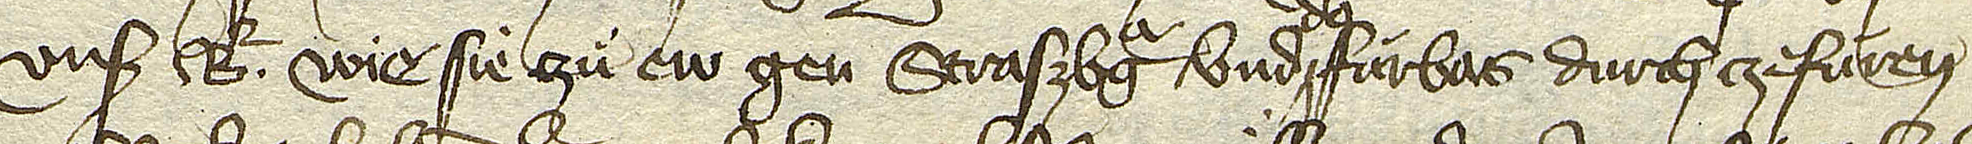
vnſ* B* . wie ſie cʒü ew gen Straſʒb*g / vnd fürbas durch cʒefüren
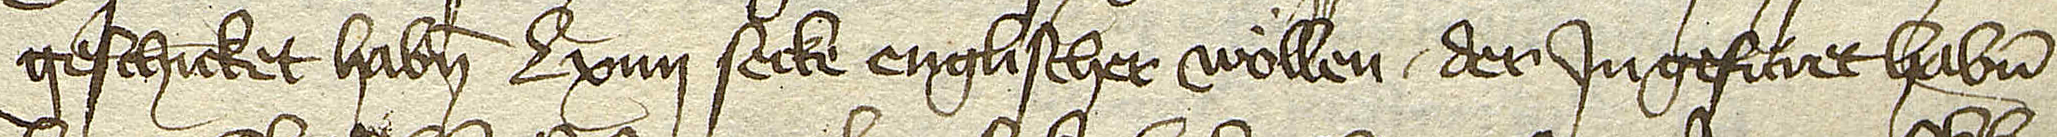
geſchicket habn* Lxiiii ſecke engliſcher wöllen / der In gefüret habn*
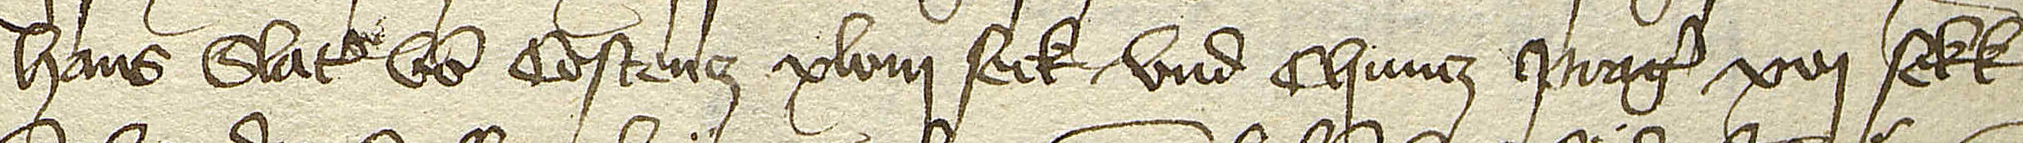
hans Slat* vo* Coſtencʒ xlviii ſeck / vnd Chuncʒ Prag* xvi ſekk*
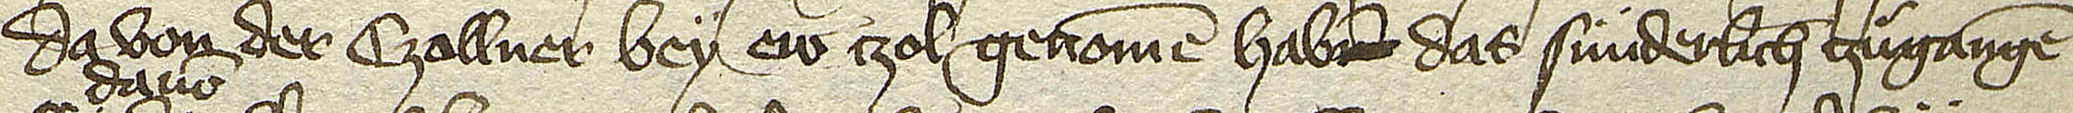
da von der Cʒollner bey ew cʒol genome* habn* das ſünderlich cʒügange*
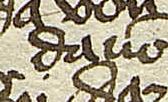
dauo*
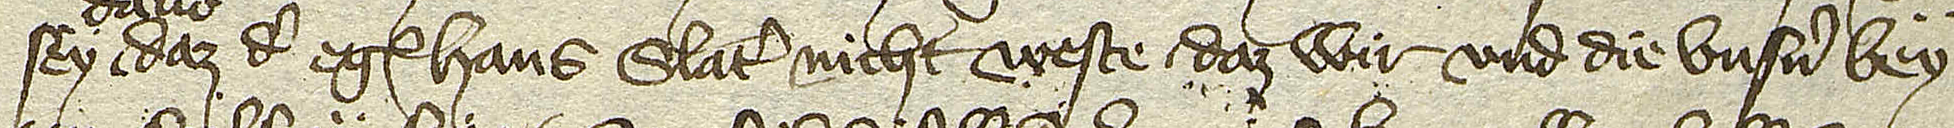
ſey / daʒ d* eg* hans Slat* nicht weſte / daʒ wir vnd die vnſn* bey
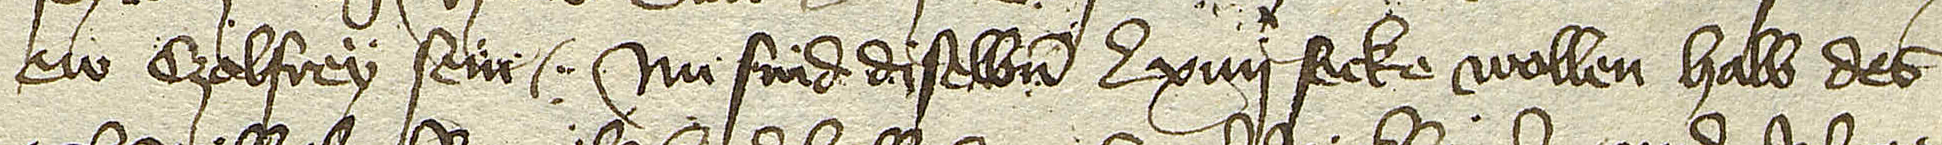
ew Cʒolfrey ſein / . Nu ſind diſelbn* Lxiiii ſecke wollen halb des
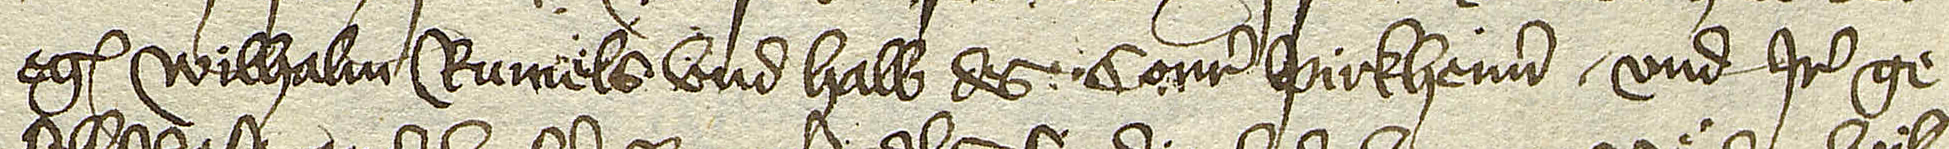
eg* wilhalm Rumels vnd halb des Conr* Prikheim* / vnd Ir* ge
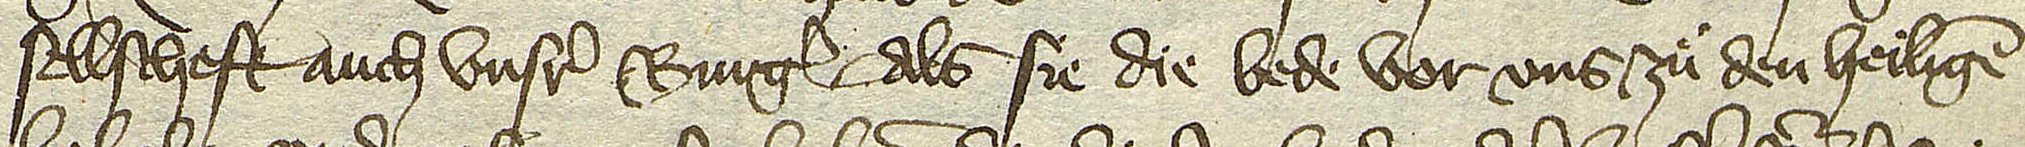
ſellſcheft auch vnſr* Burg* / Als ſie die bede vor vns cʒü den heilige*
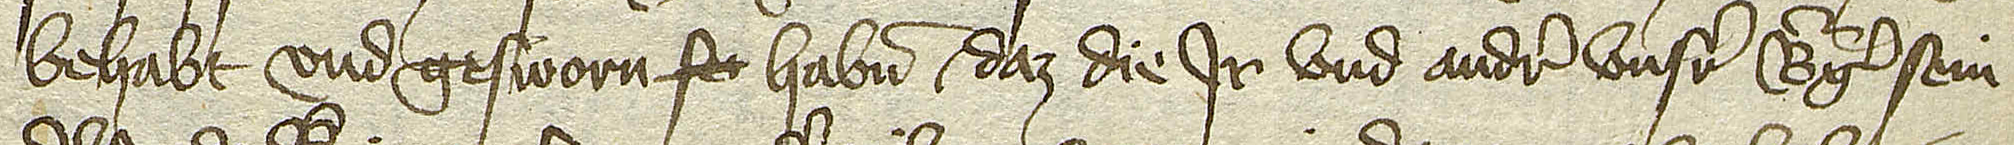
behabt vnd geſworn fei habn* / daʒ die Ir vnd andr* vnſr* B*g* ſein
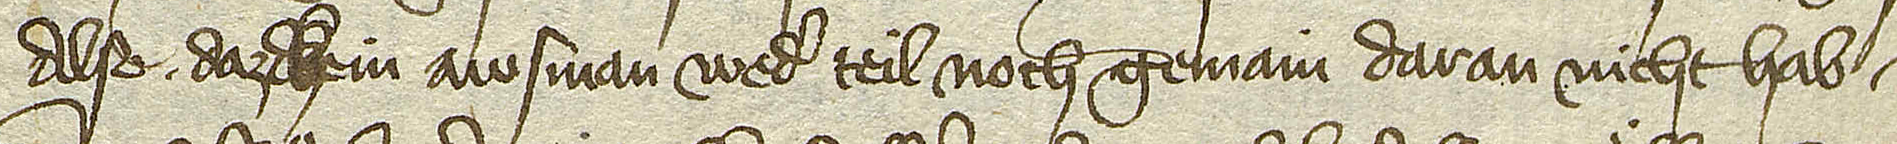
Alſo / daʒ dhein awſman wed* teil noch gemain daran nicht hab /
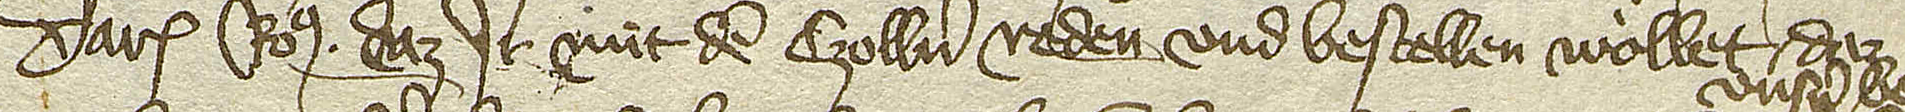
Dar* Ro* . daʒ Ir mit d* Cʒolln* reden vnd beſtellen wöllet / daʒ
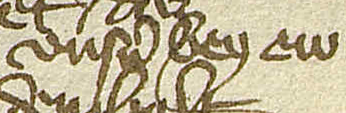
vnſn* bey ew
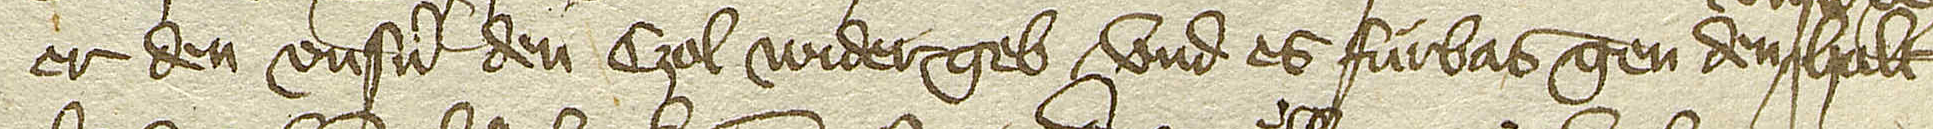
er den vnſn* den Cʒol widergeb / vnd es fürbas gen den halt
